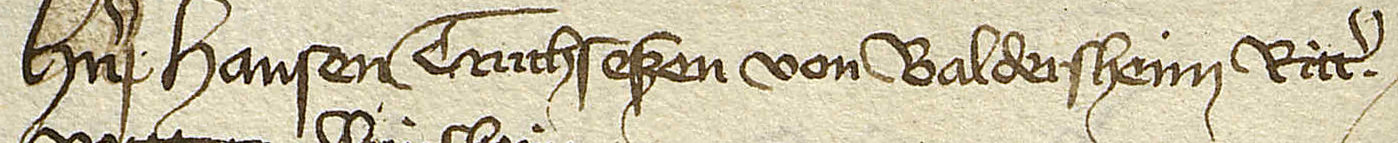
Hn* Hanſen Truchſeſʒen von Balderſheim Ritt* . /
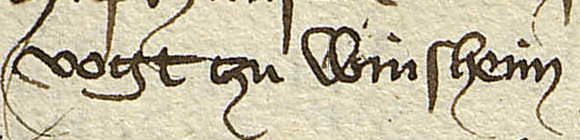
vogt cʒu winſheim
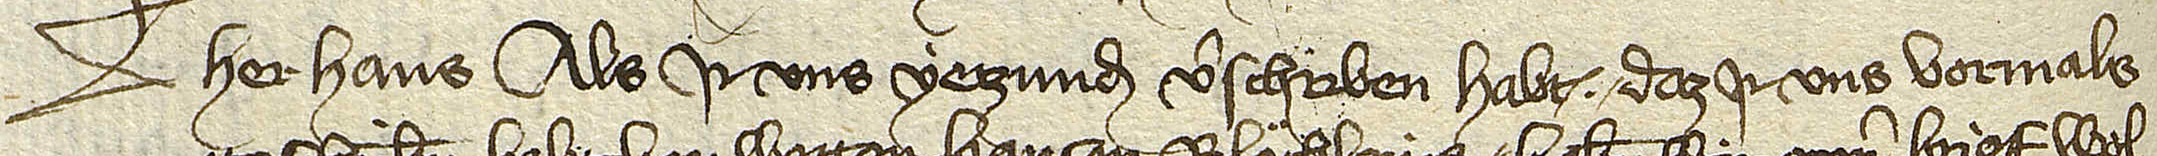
L* her hans Als Ir vns yecʒund* v*ſchriben habt . / daʒ Ir vns vormals
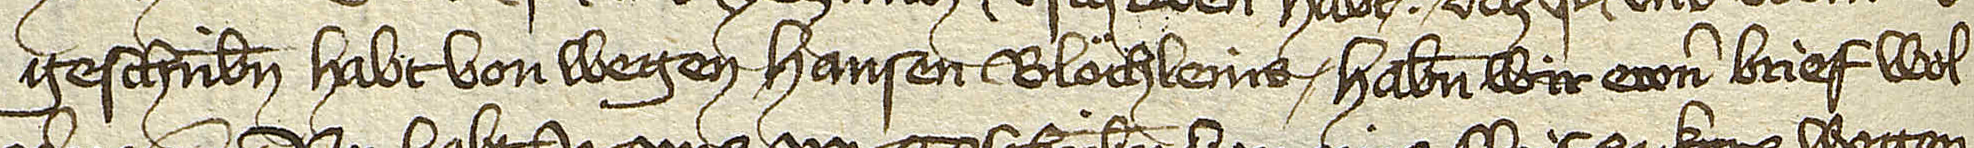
geſchribn* habt von wegen Hanſen Blöchleins / habn* wir ewn* brief wol
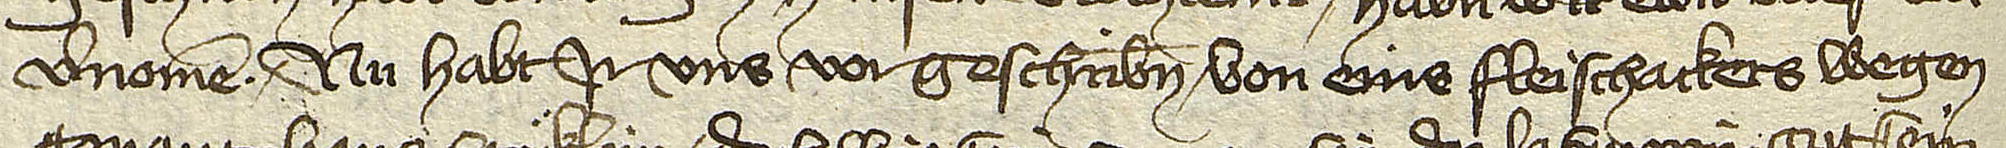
v*nome* . / Nu habt Ir vns vor geſchribn* / von eins fleiſchackers wegen
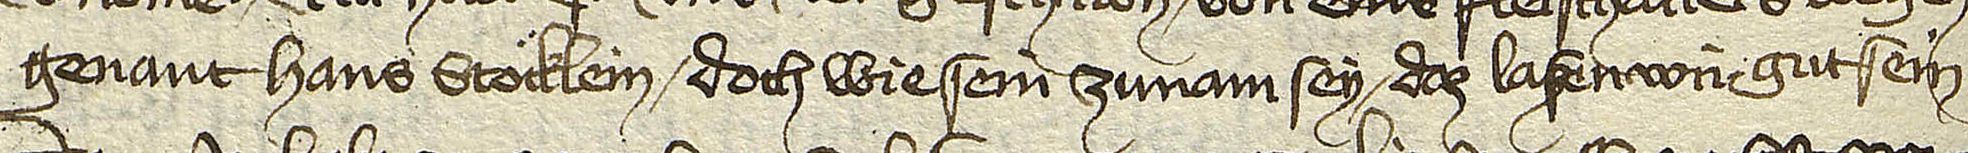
genant hans Stöcklein / doch wie ſein cʒunam ſey / daʒ laſʒen wir gut ſein
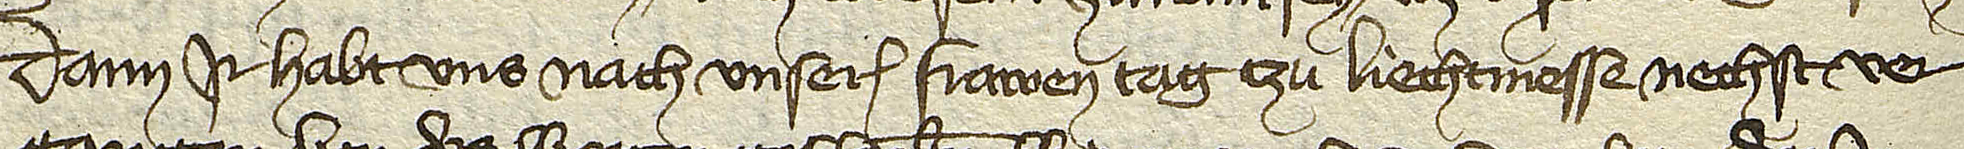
dann Ir habt vns nach vnſer* frawen tag cʒu liechtmeſſe nechſt ver
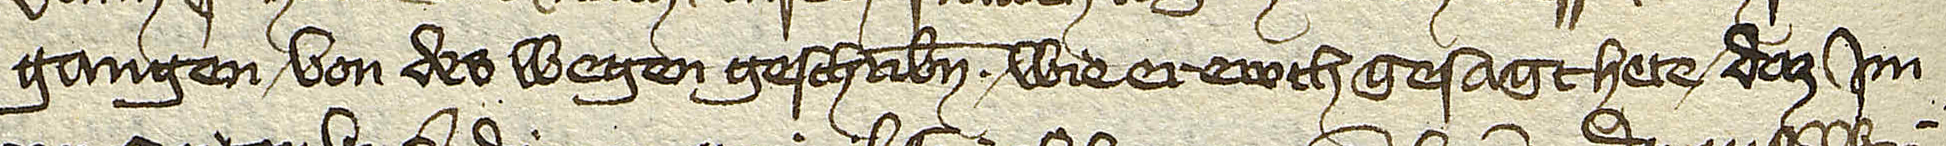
gangen / von des wegen geſchribn* . / wie er ewch geſagt hete / daʒ Im
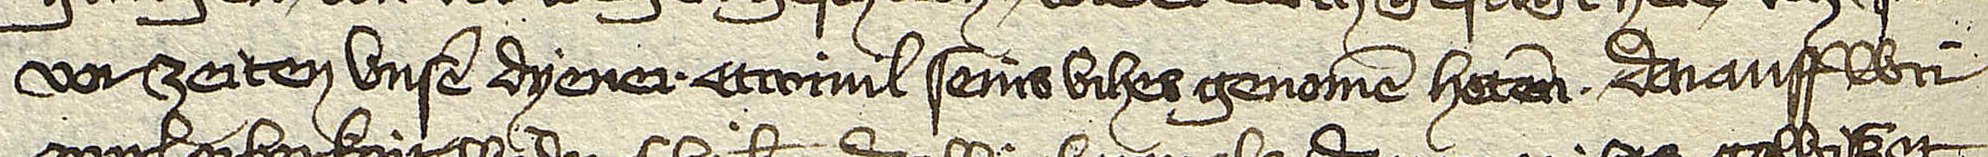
vor cʒeiten vnſe* dyener erwiuil ſeins vihes genome* heten* . / Darauff wir
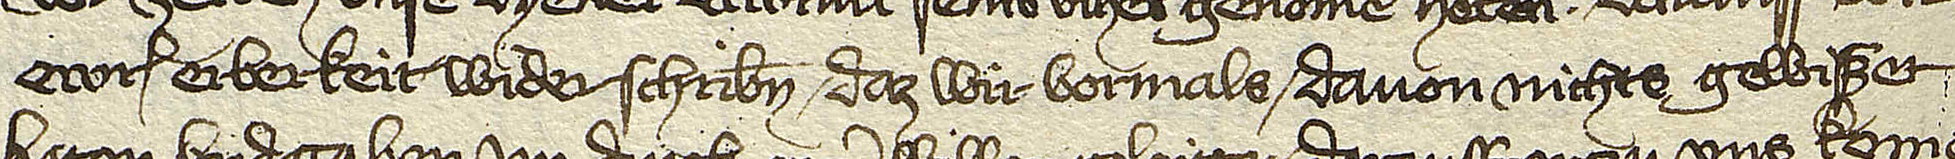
ewr* erberkeit wider ſchribn* / daʒ wir vormals / dauon nichts gewiſʒet
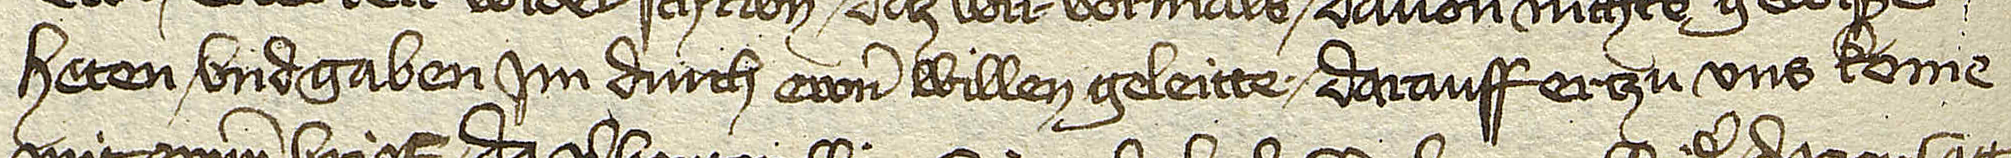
heten / vnd haben Im durch ewn* willen geleitte / darauff er cʒu vns kome
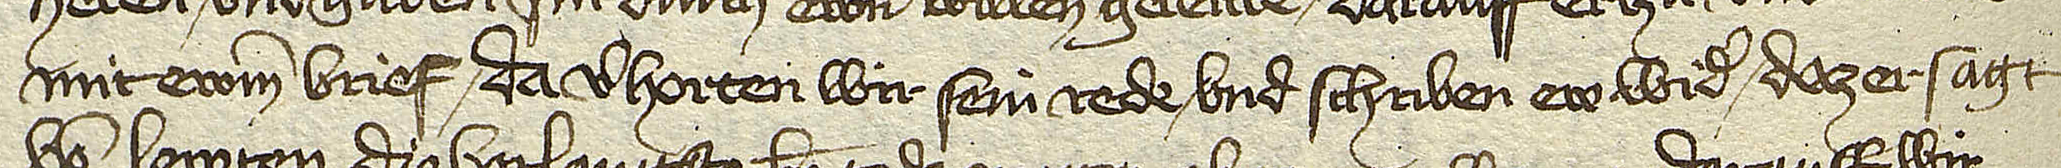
mit ewm* brief / da v*horten wir ſein rede / vnd ſchriben ew wid* / daʒ er ſagt
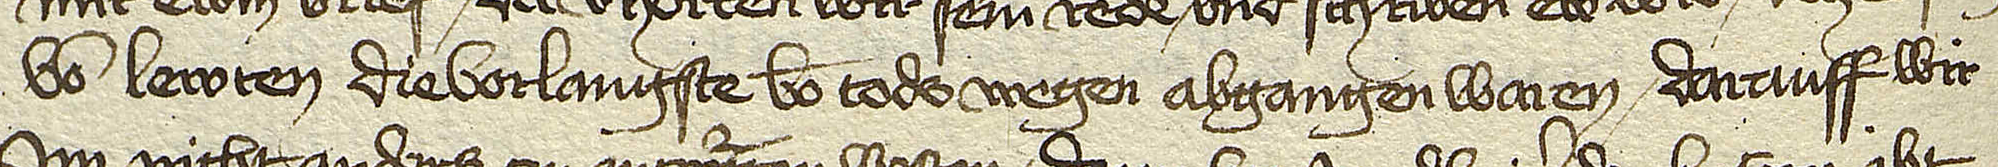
vo* lewten die vorlangſte vo* tods wegen abgangen waren / darauff wir
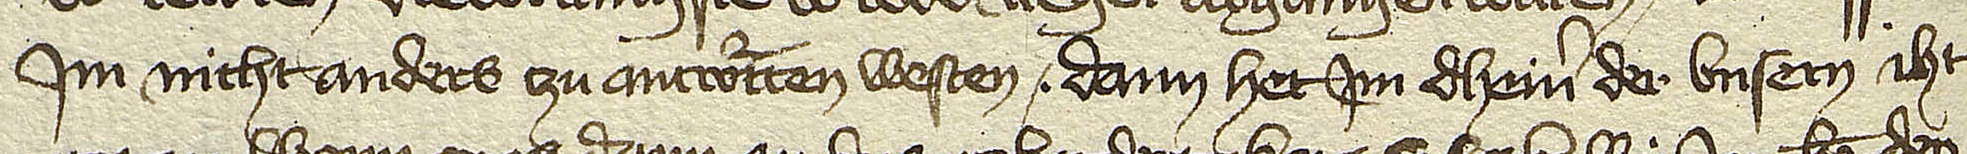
Im nicht anders cʒu antwtten* weſten / . dann het Im dhein* der vnſern iht
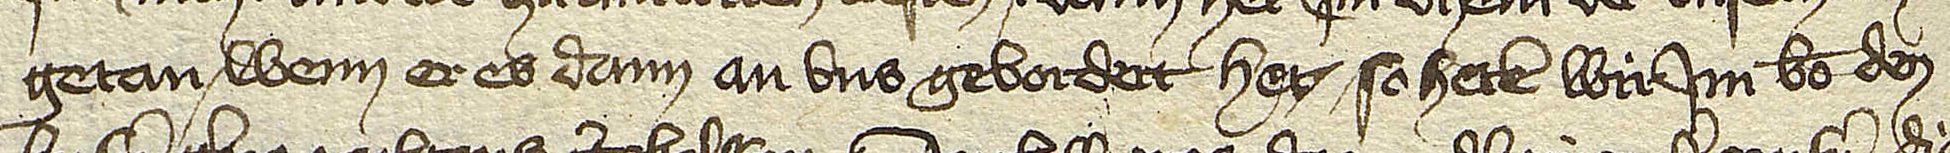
getan / wenn er es dann an vns gevordert het / ſo hete* wir Im vo* den
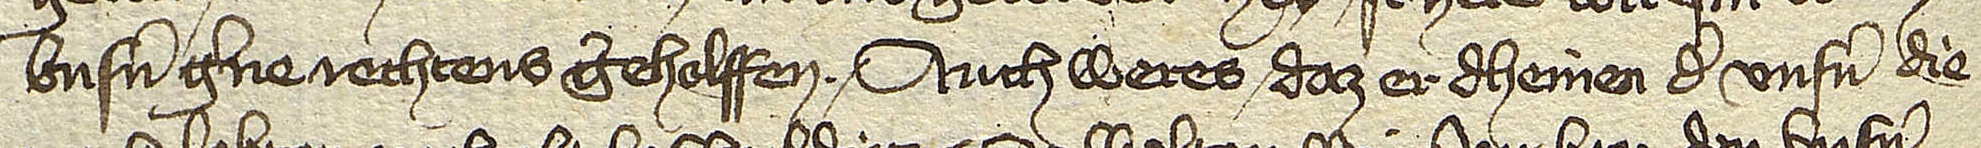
vnſn* g*ne rechtens geholffen . / Auch weres / daʒ er dheinen d* vnſn* die
